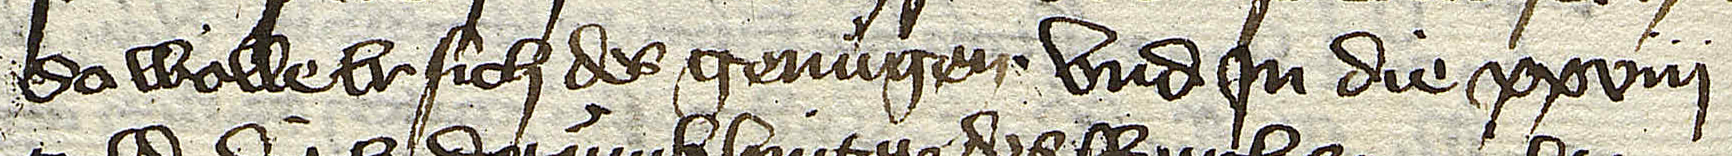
So wölle Er ſich des genügen . Vnd In die xxviii
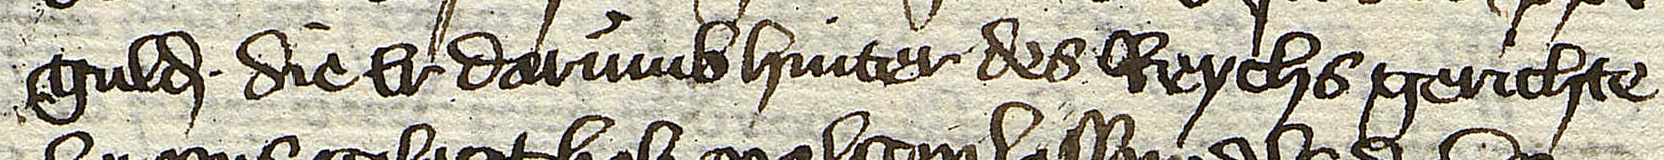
guld* . die Er darümb hinter des Reychs gerichte
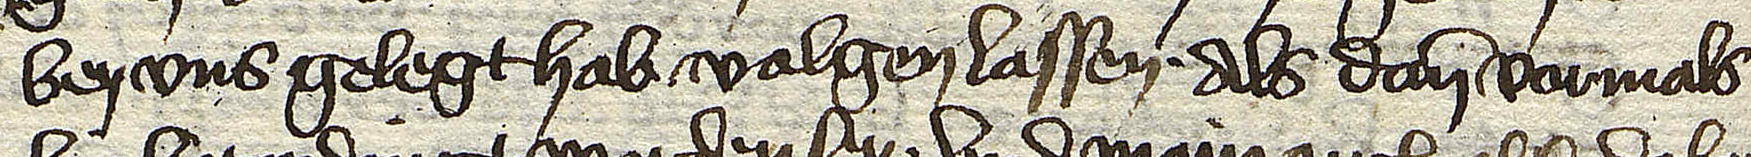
bey vns gelegt hab volgen laſſen . Als dan* vormals
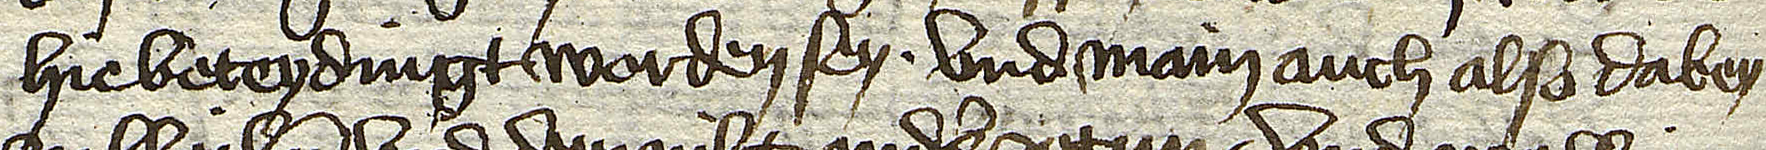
hie beteydingt worden ſey . Vnd main auch alſo dabey
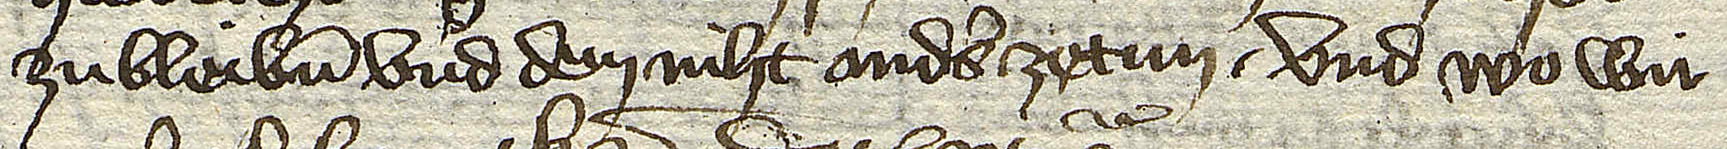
ʒu bleib*n vnd dem niht and*s ʒetun / Vnd wo wir
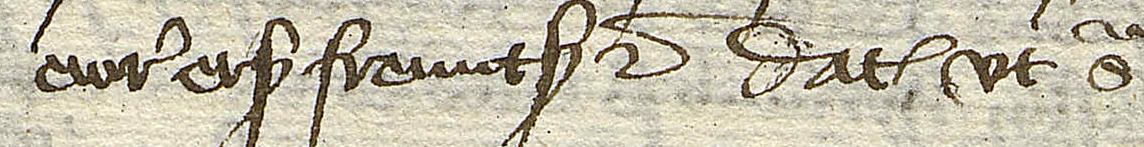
ewr* erſ* frewntſ* ec* Dat* vt* S*
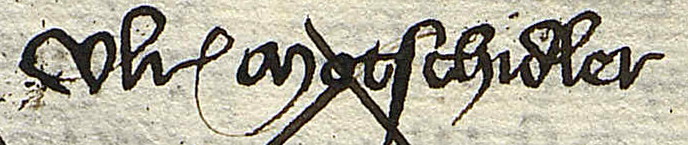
Vlr* Motſchidler
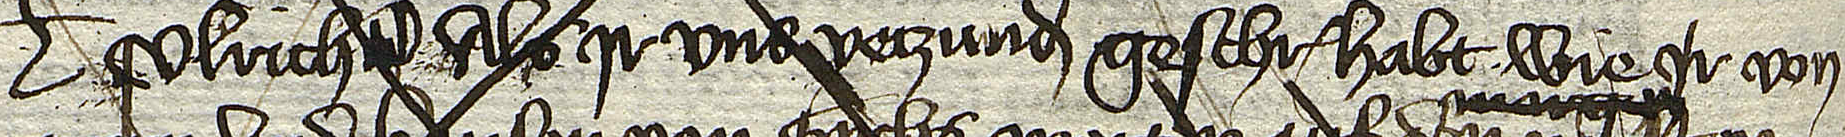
L* Vlrichn* Als Ir vns yecʒund* geſchr* habt . wie Ir von
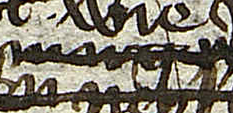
morgen
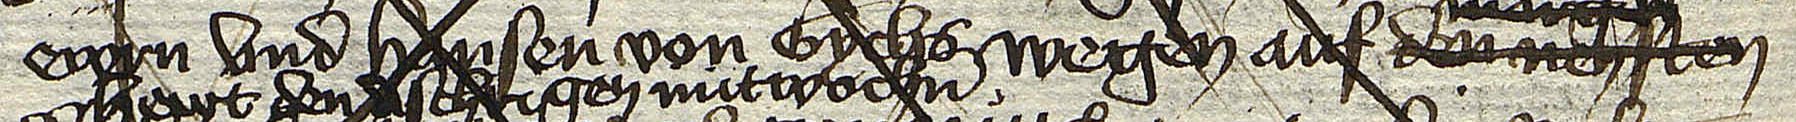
ewrn Vnd hanſen von Gychs wegen auf den nehſten
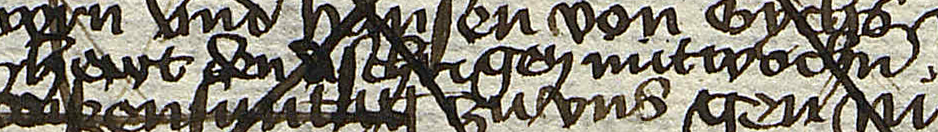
hewt den Aſchrigen mitwoch*n
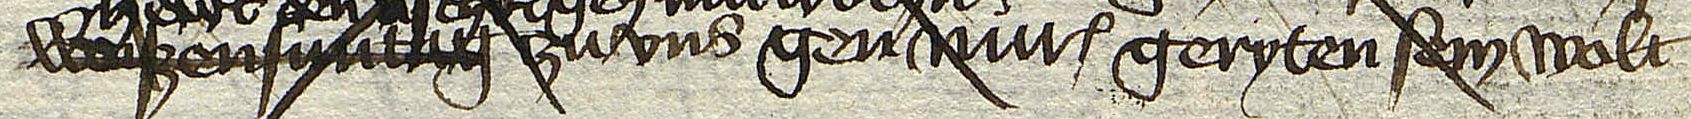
Weiſʒenſuntag cʒu vns gen* nür* geryten ſein wolt
